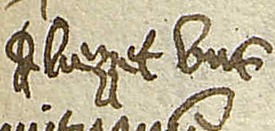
d lieʒʒet vns
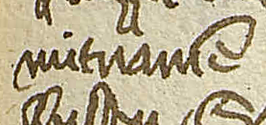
mitname*
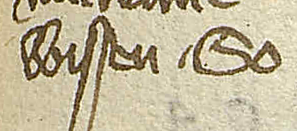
wiſſen / So
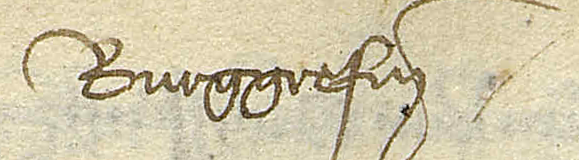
Burggrefin* /
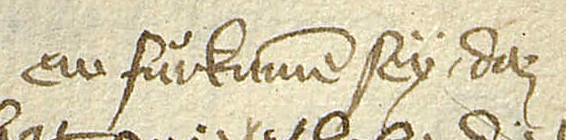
ew fürkume* ſey / daʒ
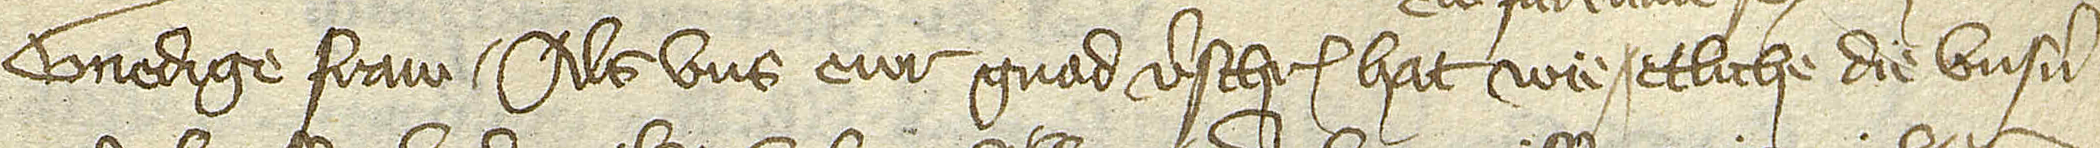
Gnedige fraw / Als vns ewr gnad v*ſchr* hat wie etliche die vnſn*
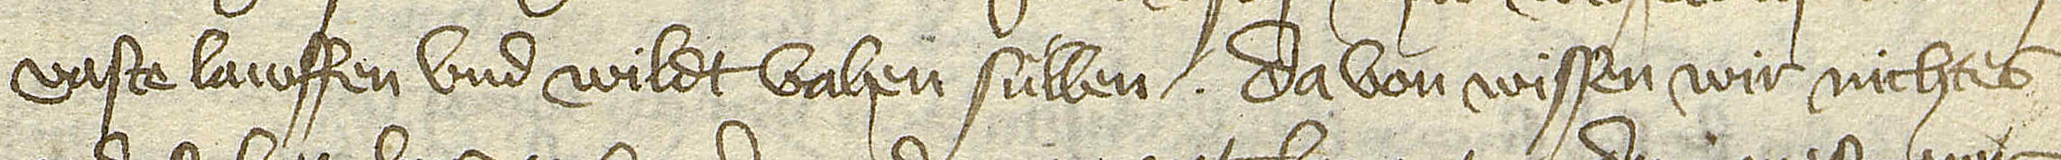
vaſte lawffen vnd wildt vahen ſüllen / . Davon wiſſen wir nichtes
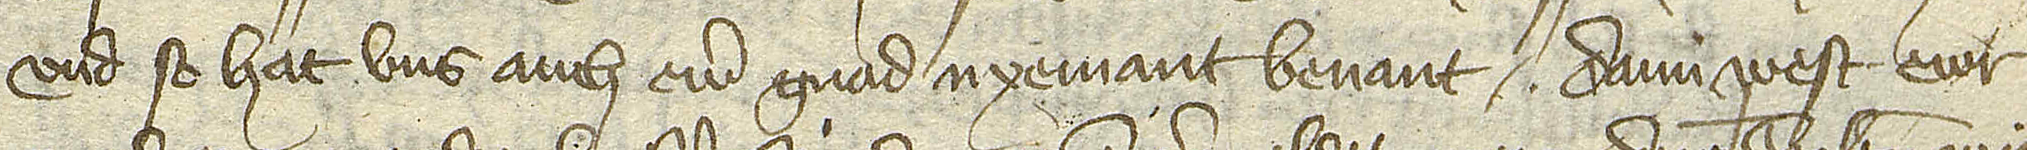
vnd ſo hat vns auch ew* gnad nyemant benant / . Dann weſt ewr
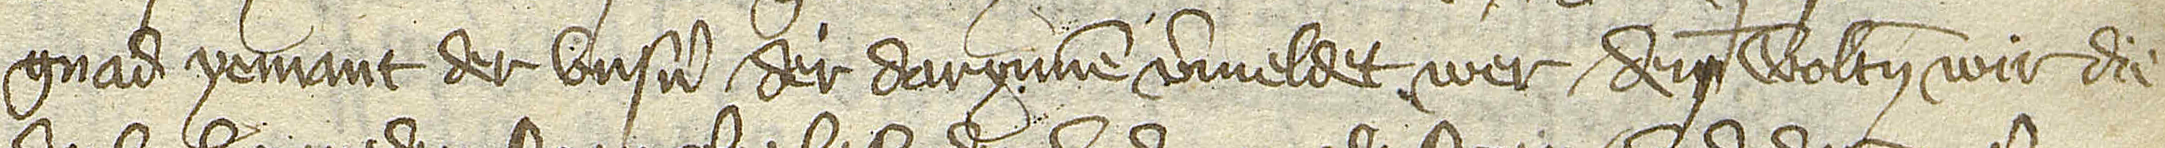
gnad yemant der vnſn* / der darynne* v*meldet wer / den woltn* wir die
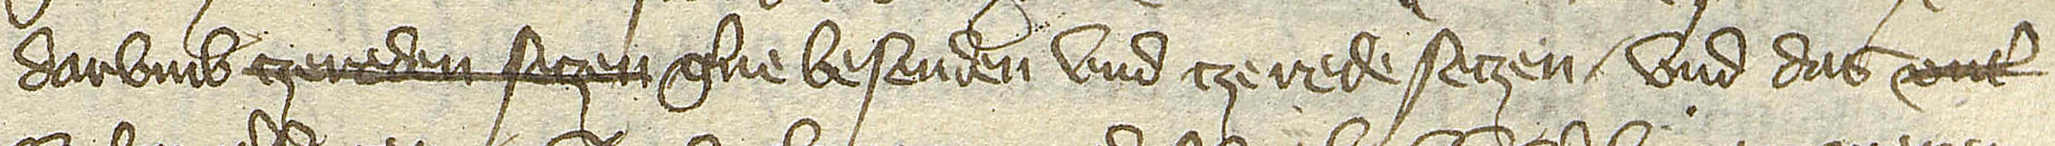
darumb cʒereden ſecʒen g*ne beſenden vnd cʒe rede ſecʒen / vnd das vnt*
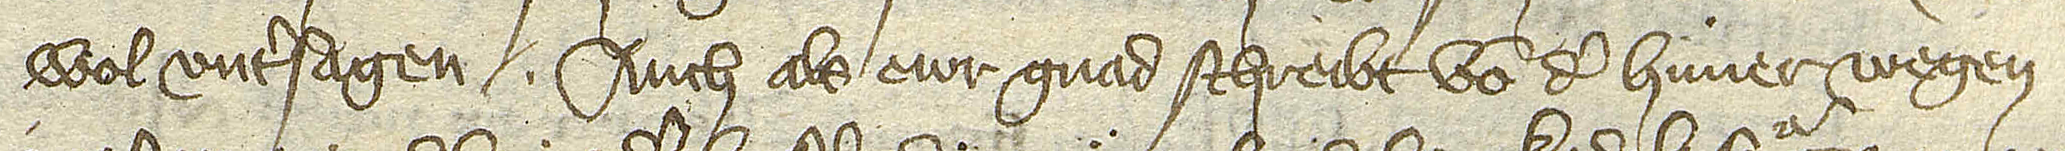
wol vnt*ſagen / . Auch als ewr gnad ſchreibt vo* d* hüner wegen
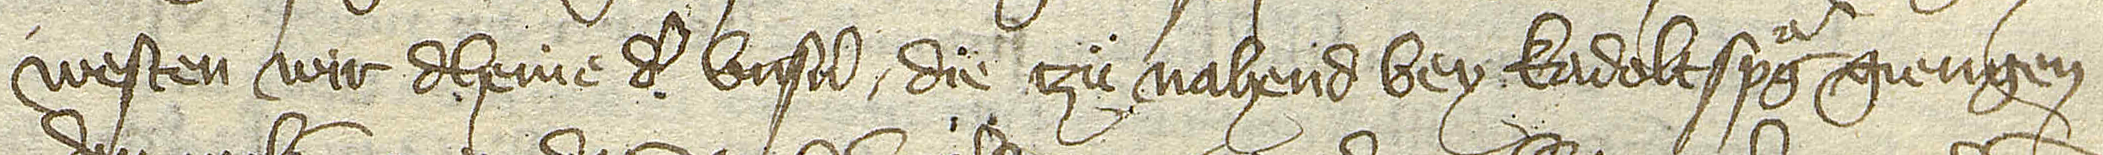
weſten wir dheine d* vnſn* / die cʒü nahend bey Kadoltſp*g giengen
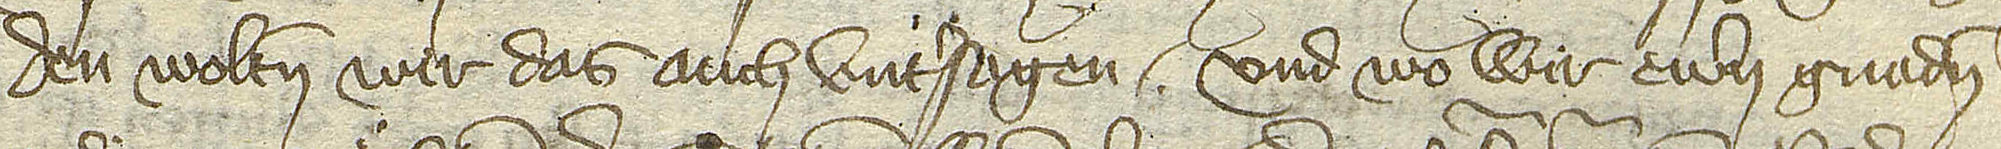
den woltn* wir das auch vnt*ſagen / . vnd wo wir ew*n gnadn*
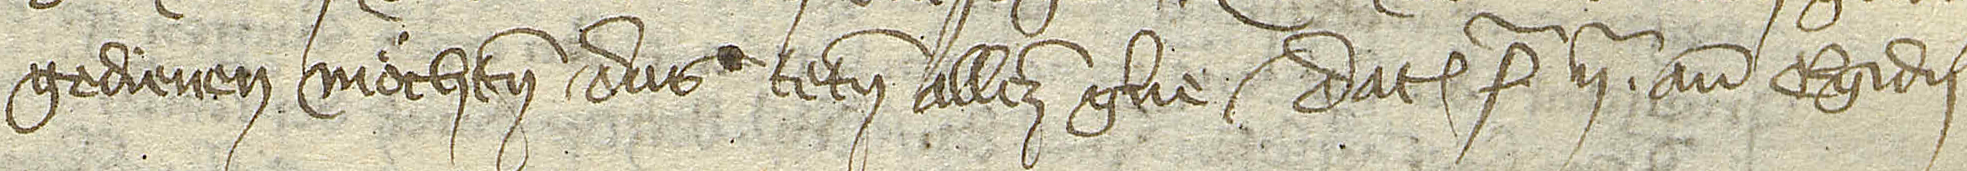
gedienen möchtn* / Das tetn* allcʒ* g*ne / Dat* f* ii*. an* Egidi*
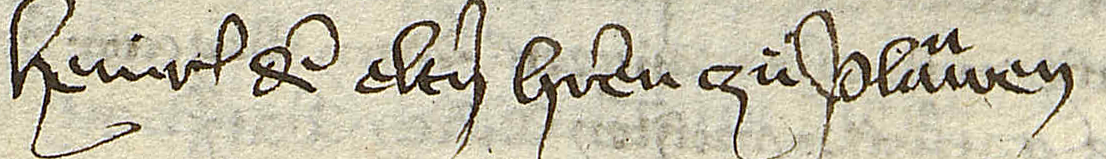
Heinr* d* eltn* hr*en cʒü Plawen
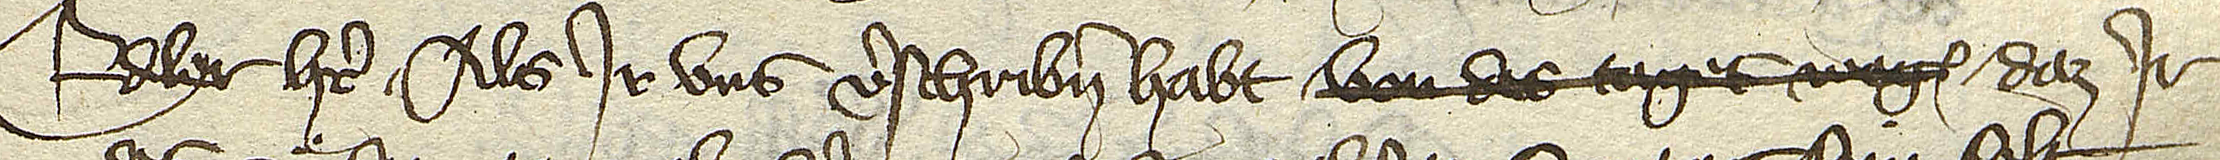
Edler hr* / Als Ir vns v*ſchribn* habt / von des tages weg* / daʒ Ir
